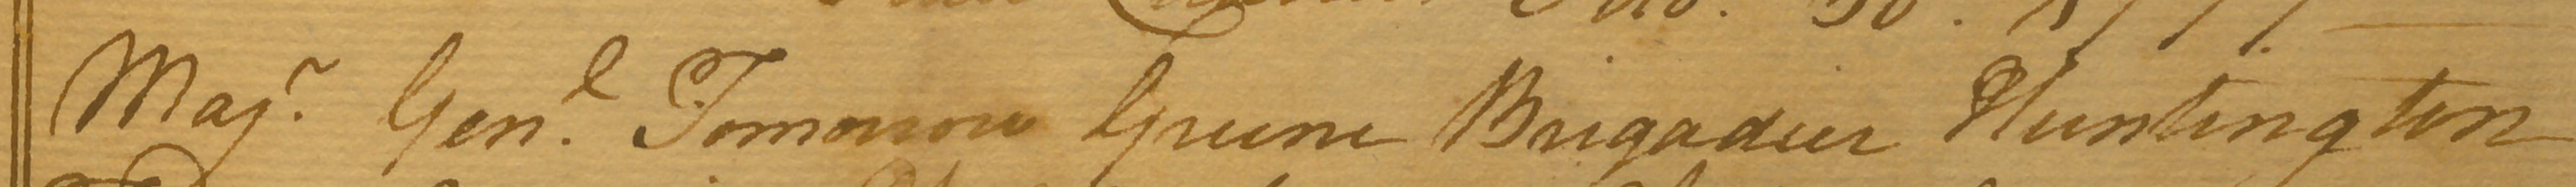Maj^r. Gen^l. Tomorrow Greene Brigadier Huntington
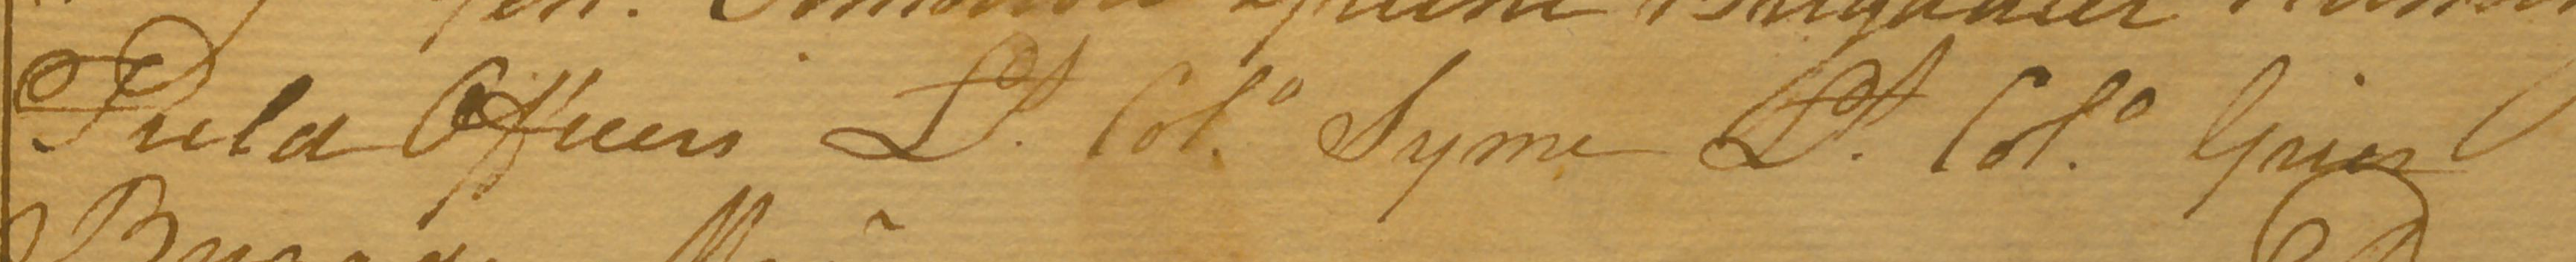Field Officers L^t. Col^o. Syme L^t. Col^o. Grier
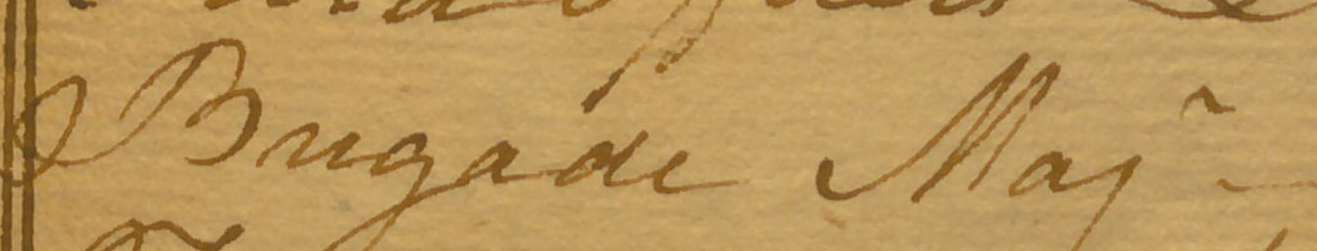Brigade Maj^r
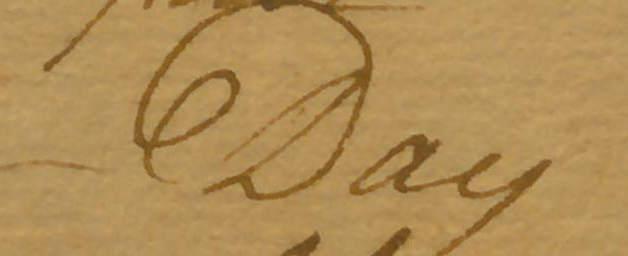Day
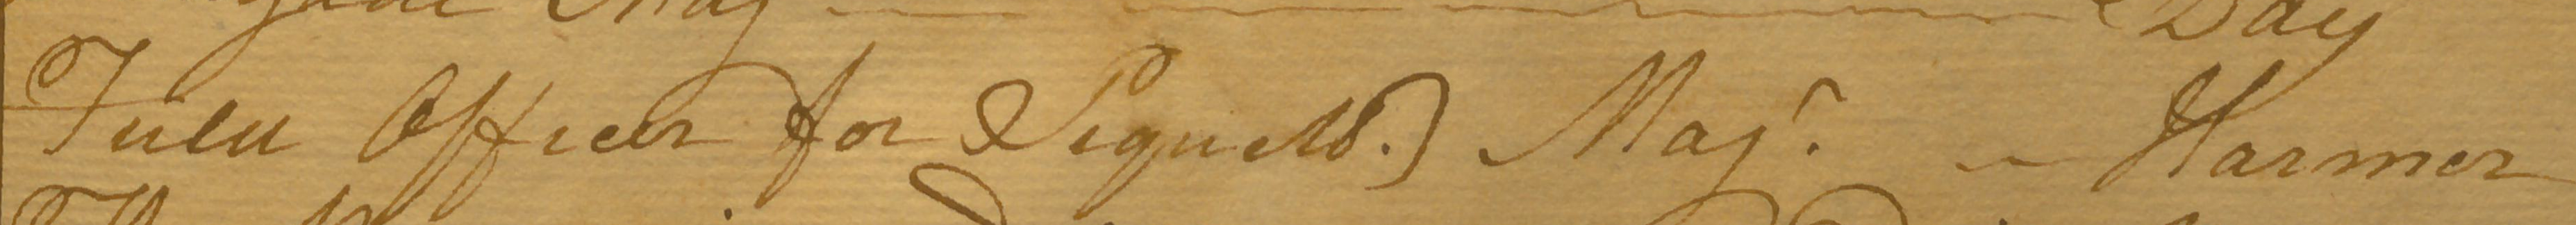Field Officer for Piquets. Maj^r. - Harmon
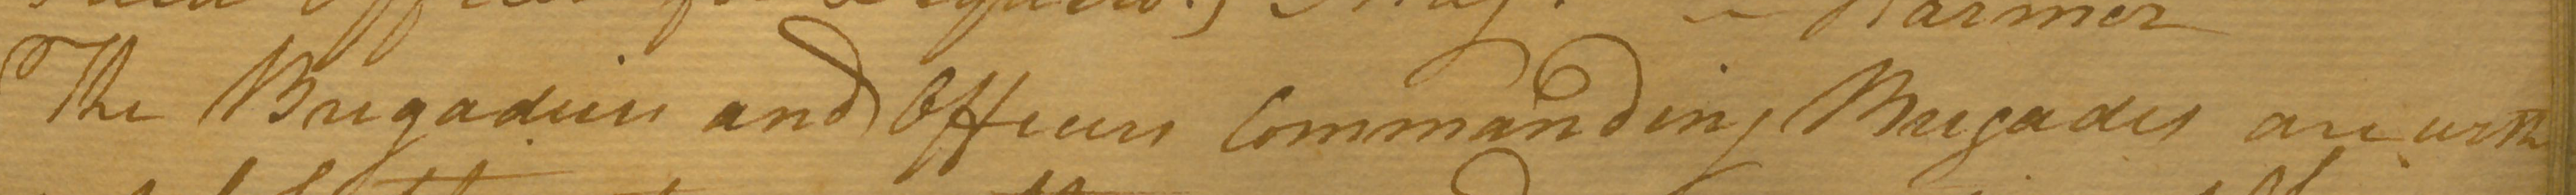The Brigadier and Officers Commanding Brigades are with
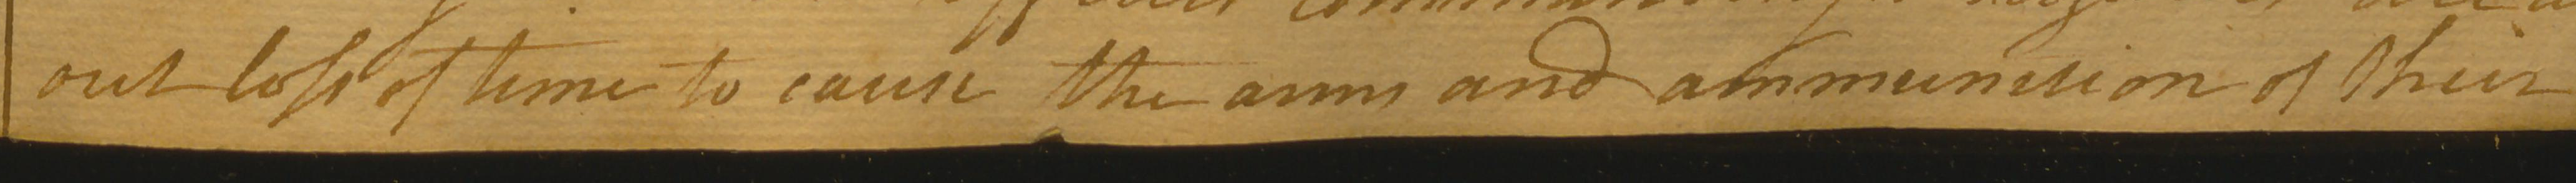out loss of time to cause the arms and ammunition of their
